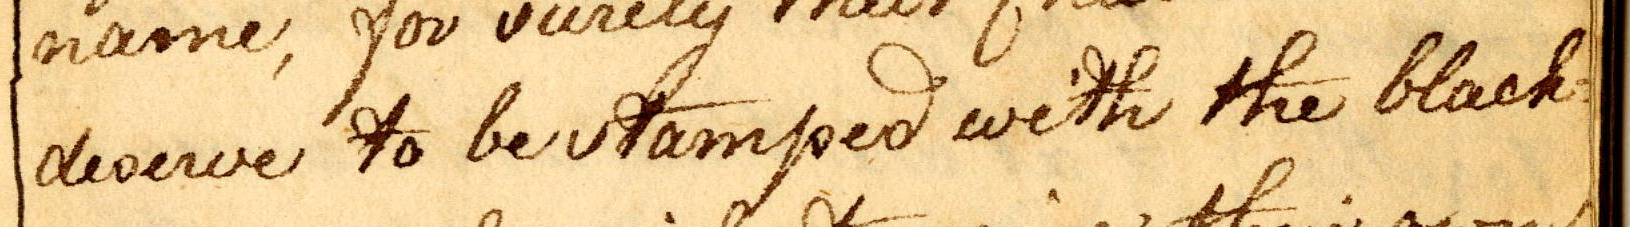deserve to be stamped with the black-
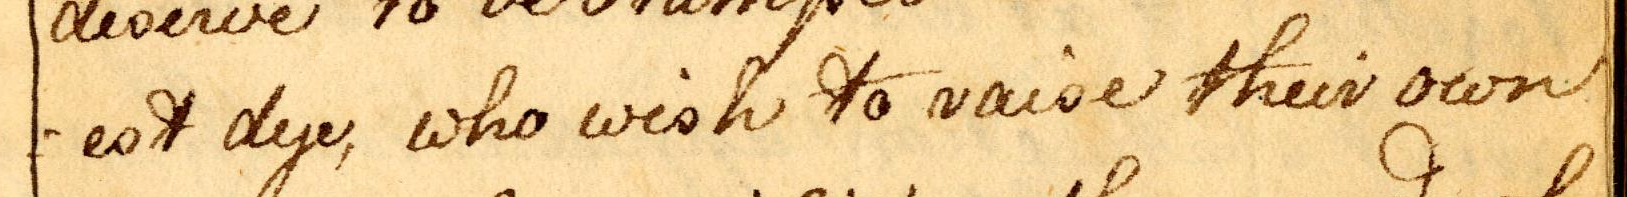-est dye, who wish to raise their own
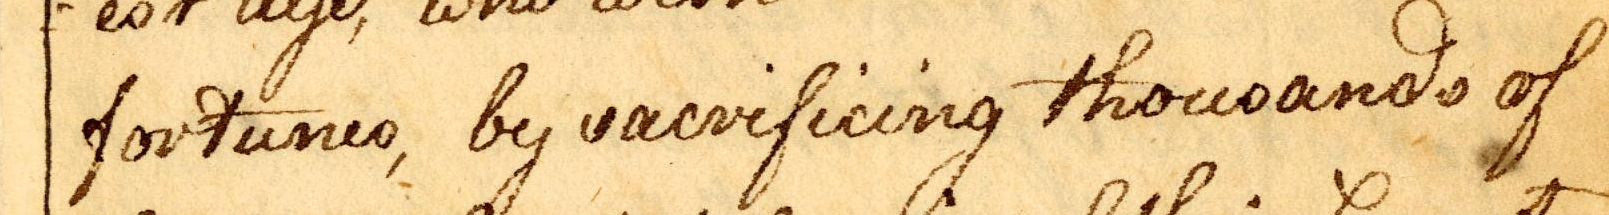fortunes, by sacrificing thousands of
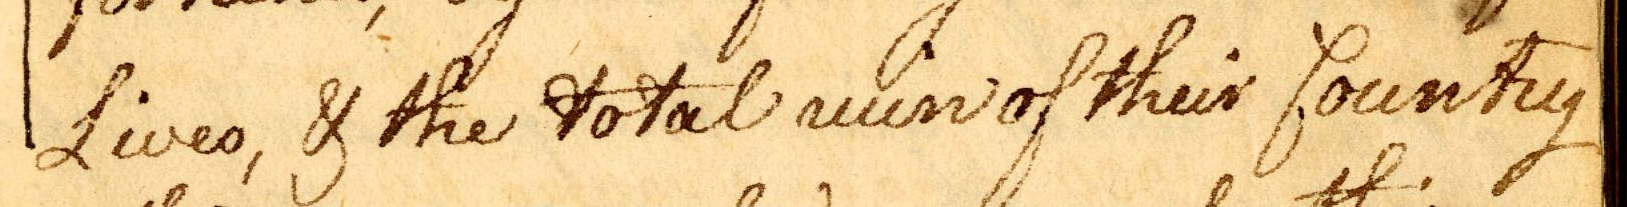Lives, & the total ruin of their Country
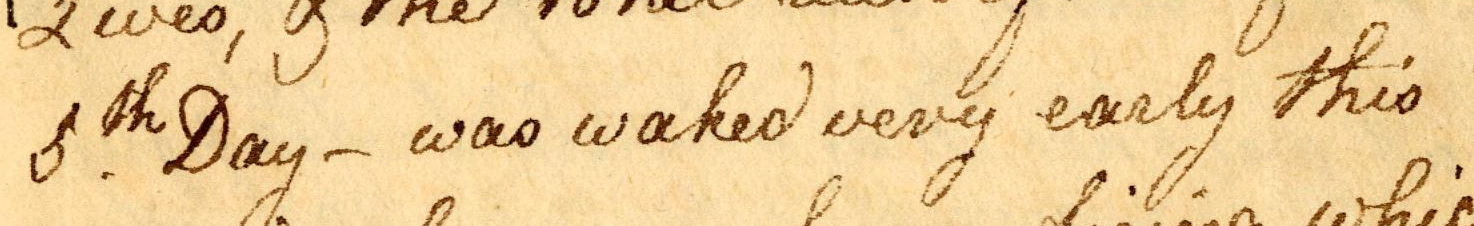5^th Day- was waked very early this
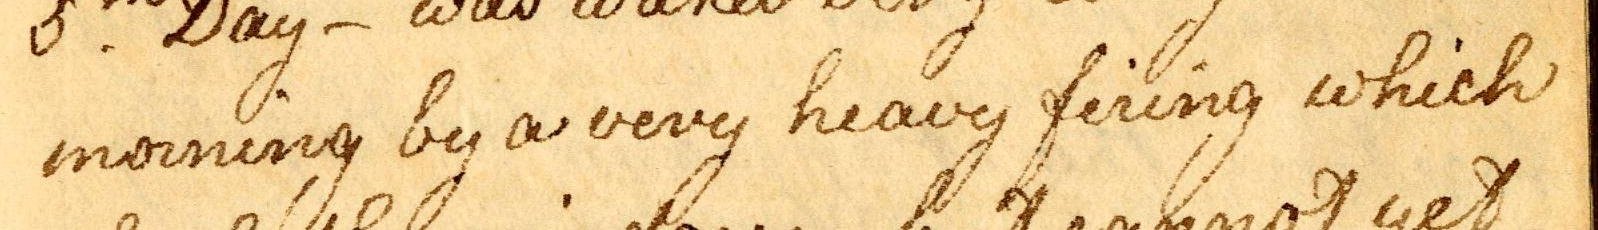morning by a very heavy firing which
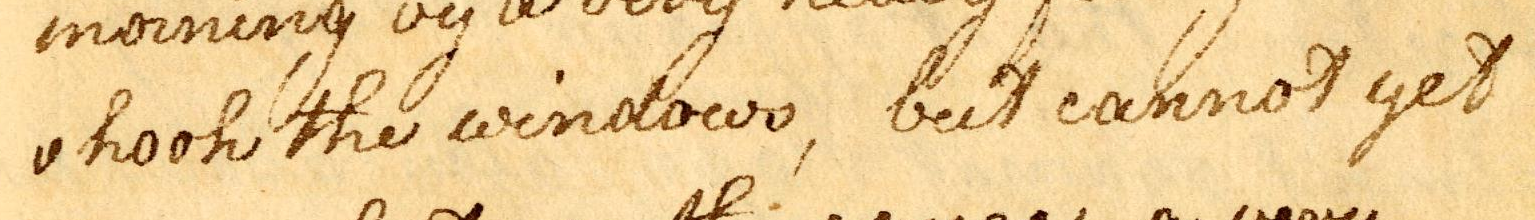shook the windows, but cannot yet
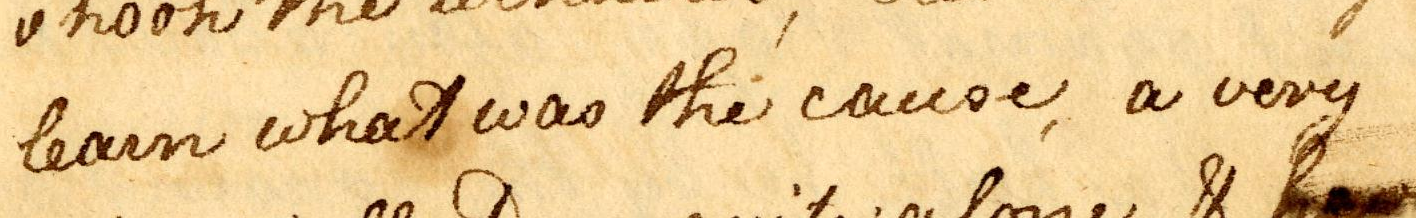learn what was the cause, a very
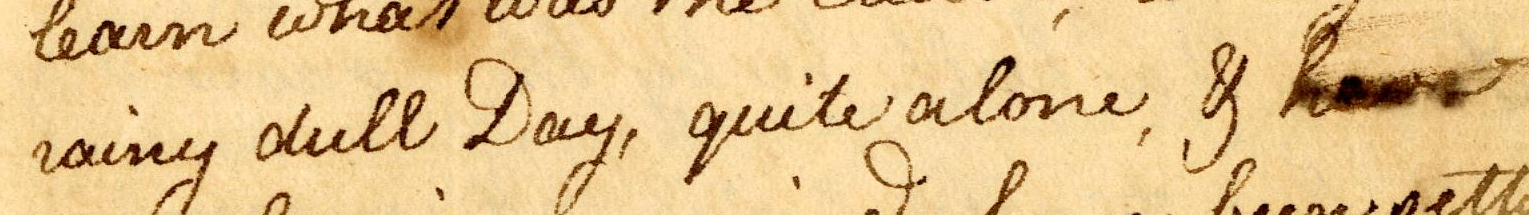rainy dull Day, quite alone, & have
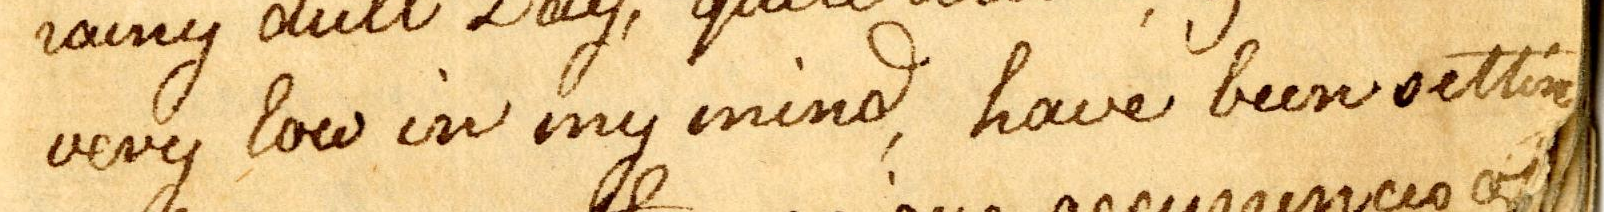very low in my mind, have been setting
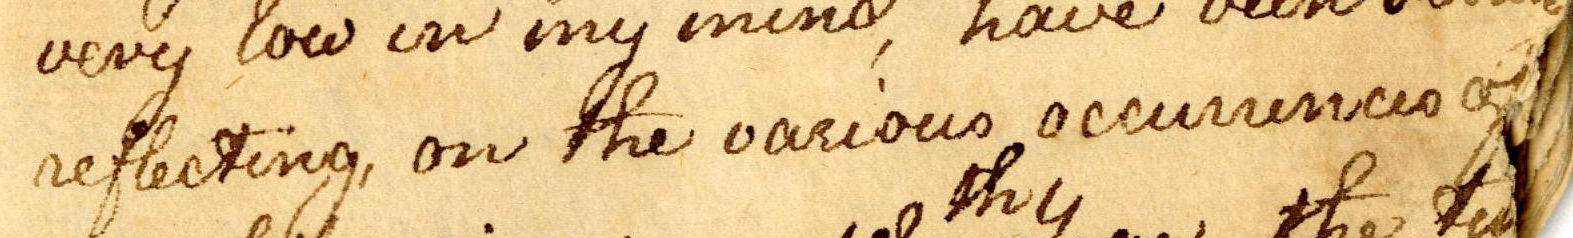reflecting, on the various occurrences of
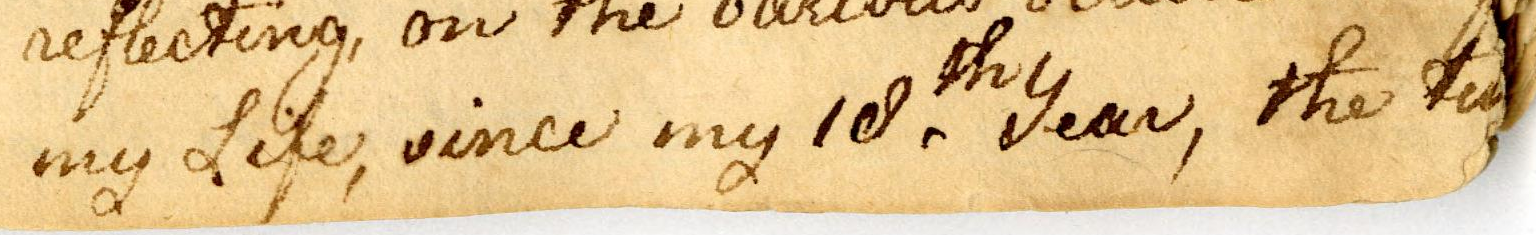my Life, since my 10^th Year, the t
